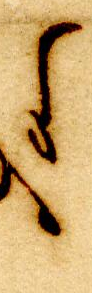To
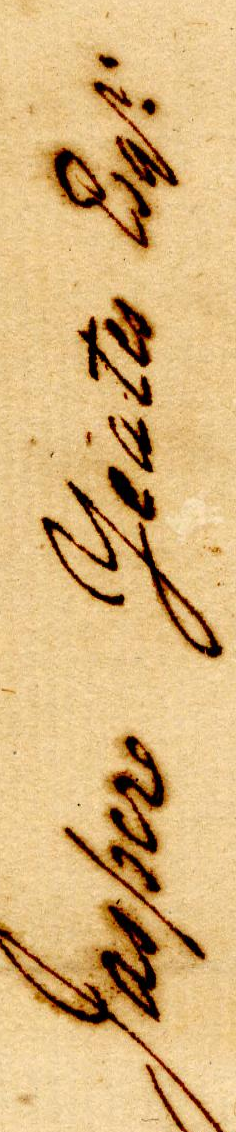Jasper Yeates Esq^r.
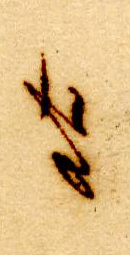at
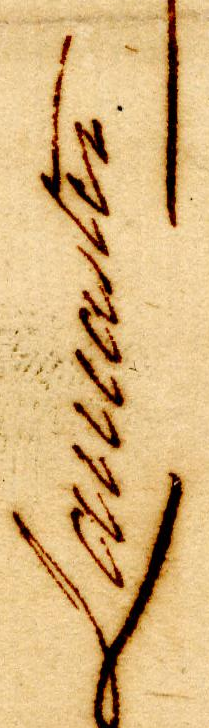Lancaster
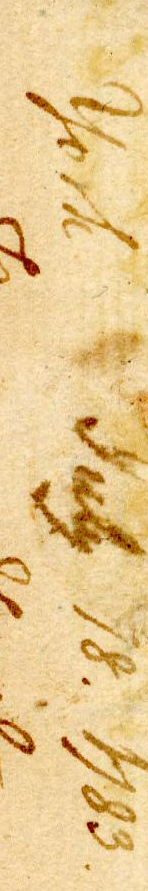York. July 18. 1783.
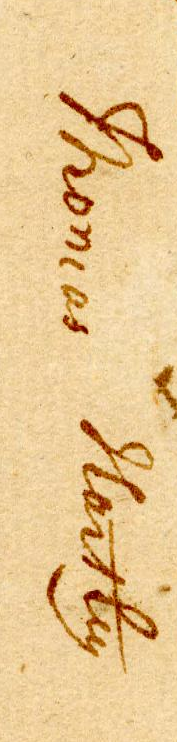Thomas Hartley
